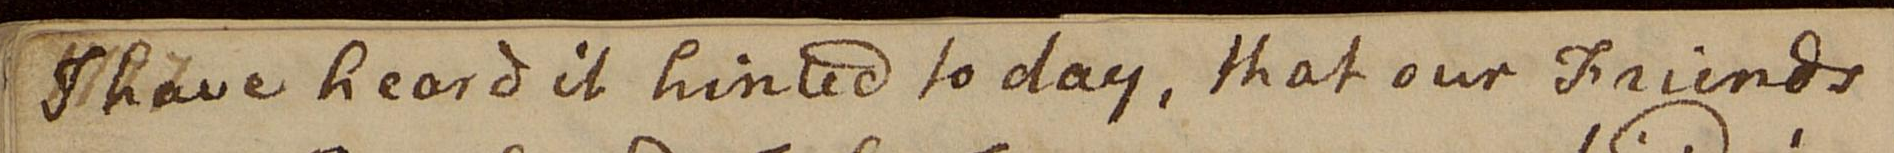I have heard it hinted to day, that our Friends
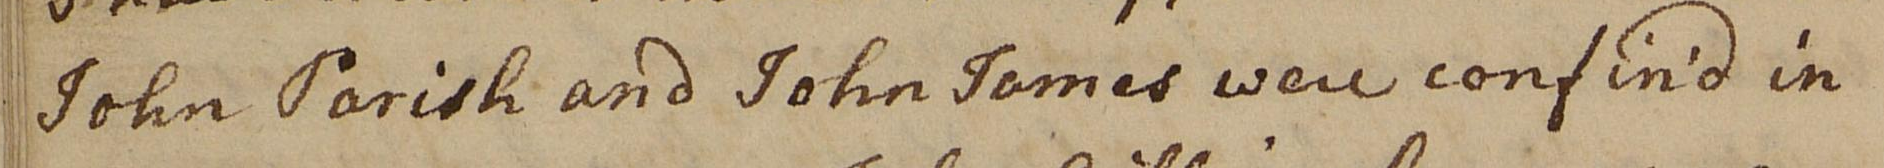John Parish and John James were confin'd in
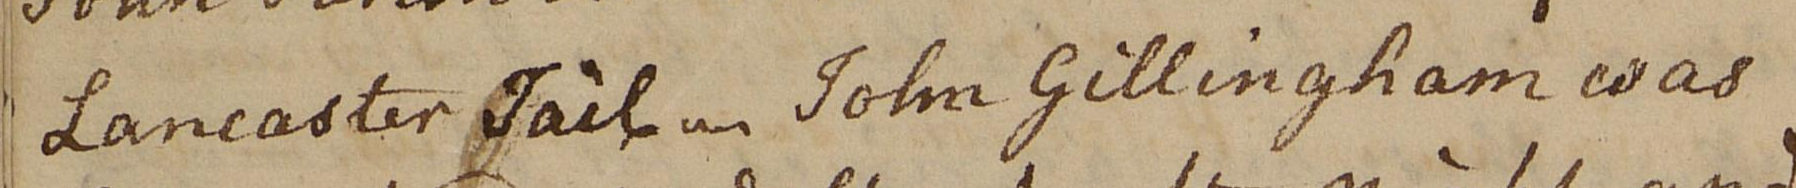Lancaster Jail- John Gillingham was
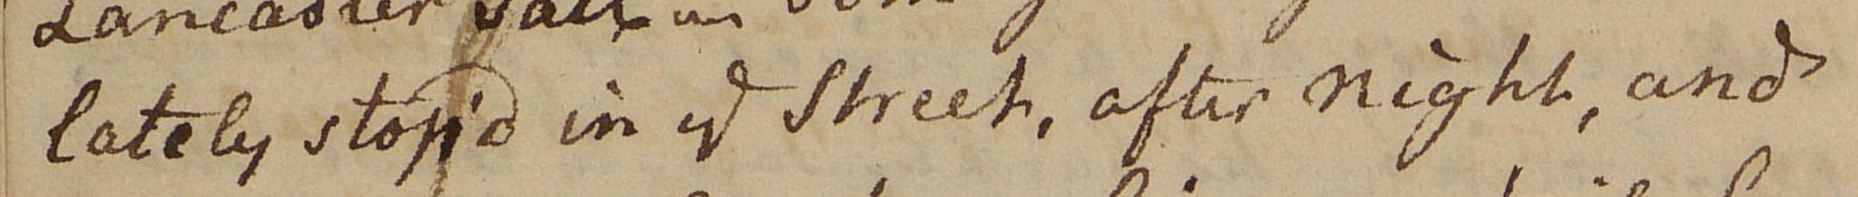lately stop'd in y^e Street, after Night, and
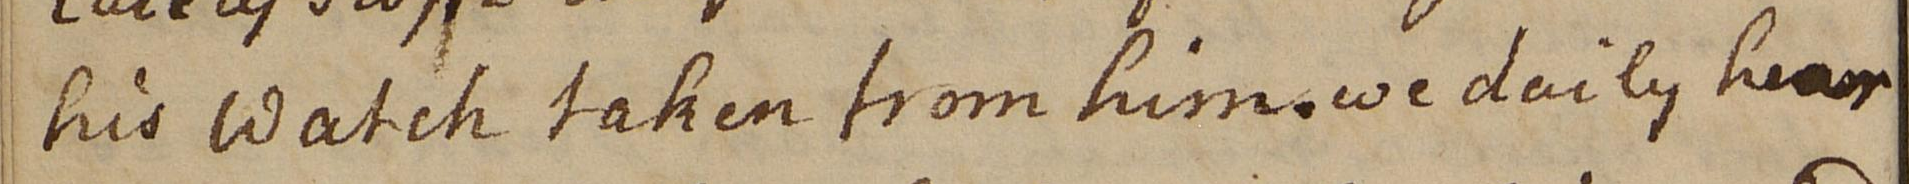his watch taken from him. we daily hear
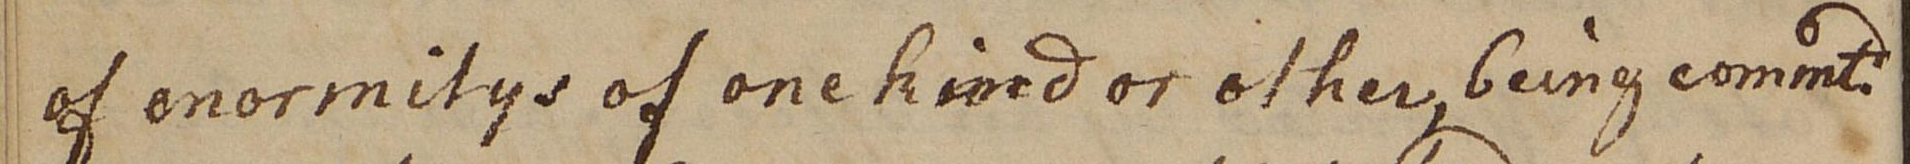of enormitys of one kind or other, being commt^d.
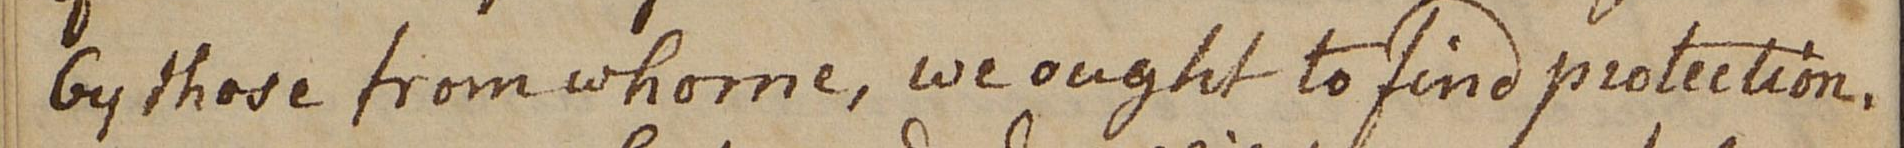by those from whome, we ought to find protection.
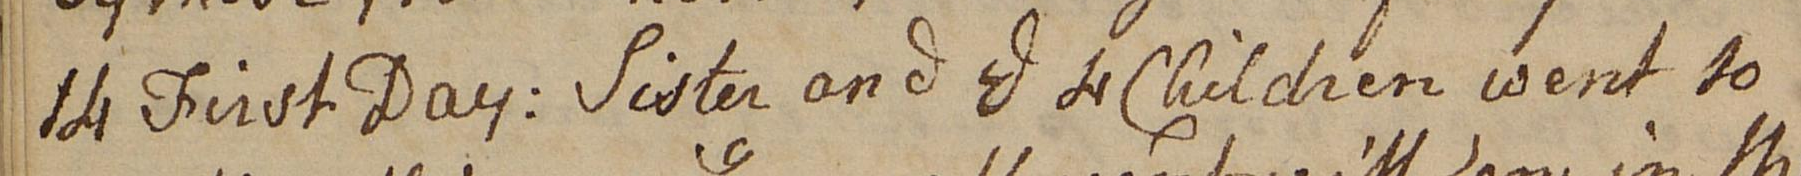14 First Day: Sister and y^e 4 Children went to
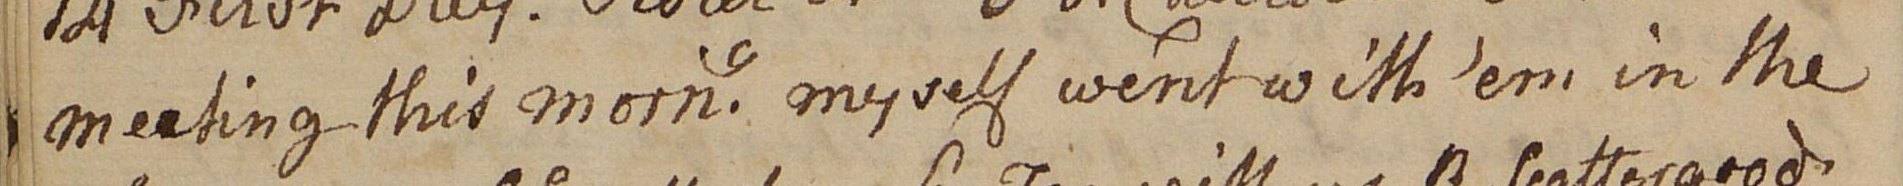meeting this morn^g. myself went with 'em in the
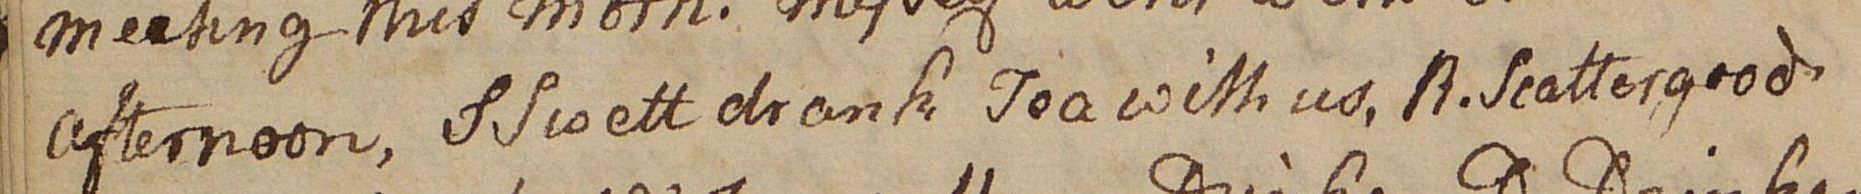Afternoon, S Swett drank Tea with us, R. Scattergood
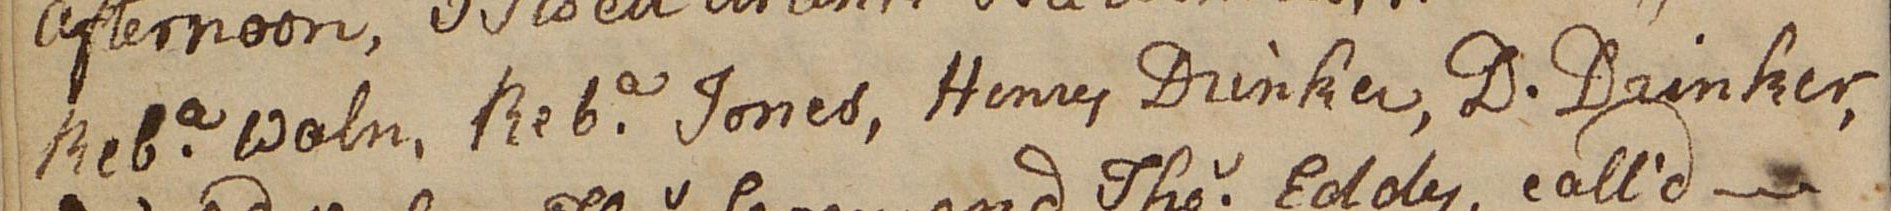Reb^a. Waln, Reb^a. Jones, Henry Drinker, D. Drinker,
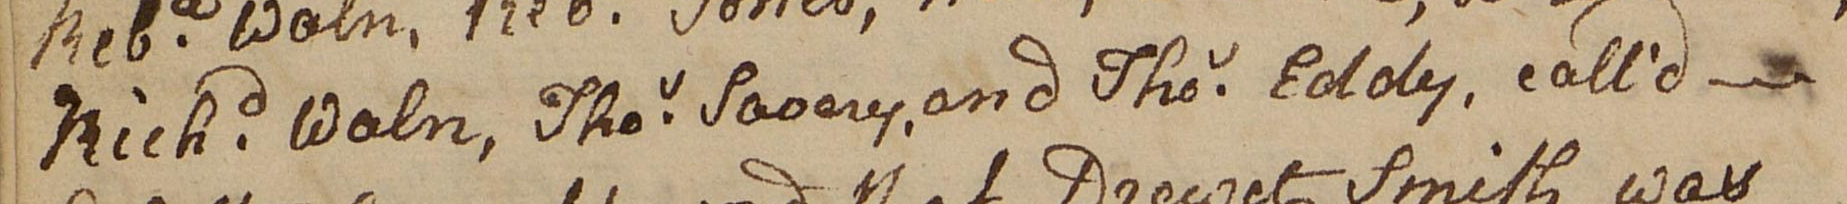Rich^d. Waln, Tho^s. Savery, and Tho^s Eddy, call'd-
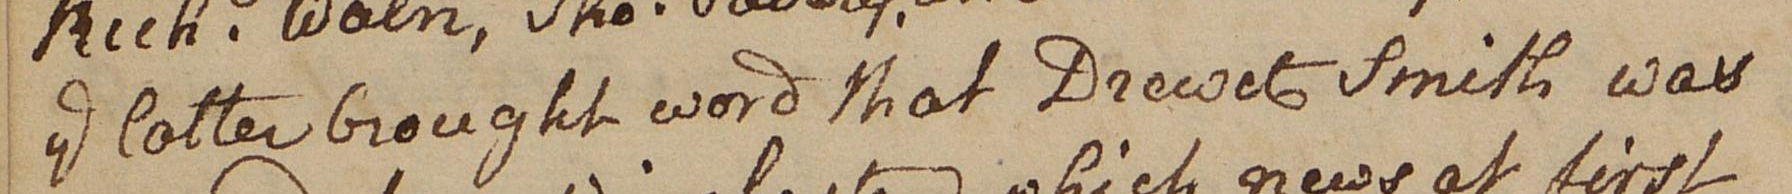y^e latter brought word that Drewet Smith was
